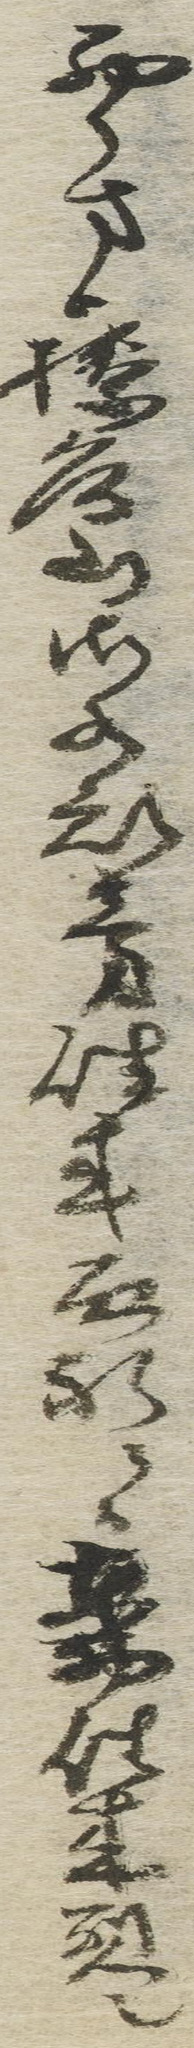西之方ハ榛名山山御水願旁往来雨願二而東西往来烈し

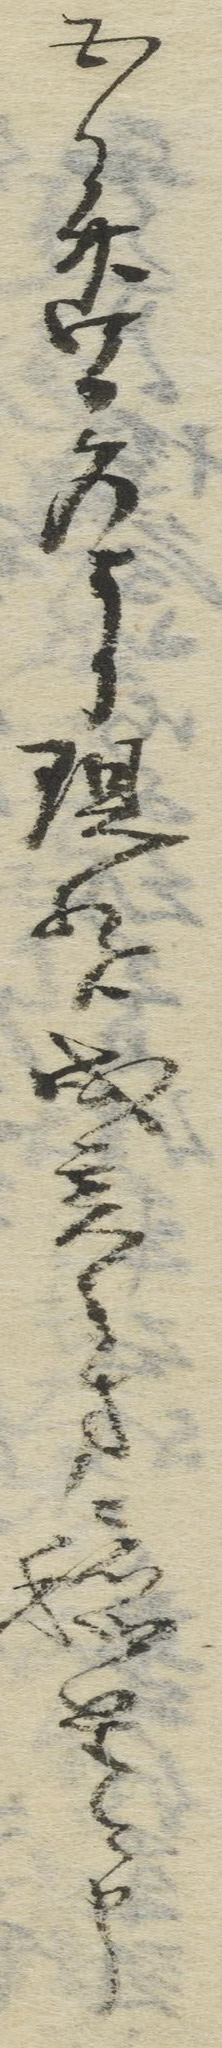五月廿四日夕より現れ候戌亥之方二稲星と申
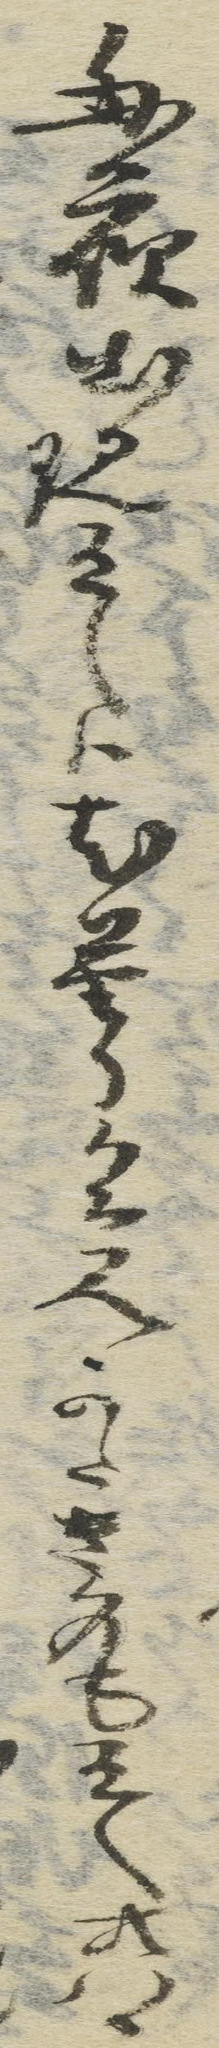当夜出現有之候尤曇り二而見かたき事も有之廿八日
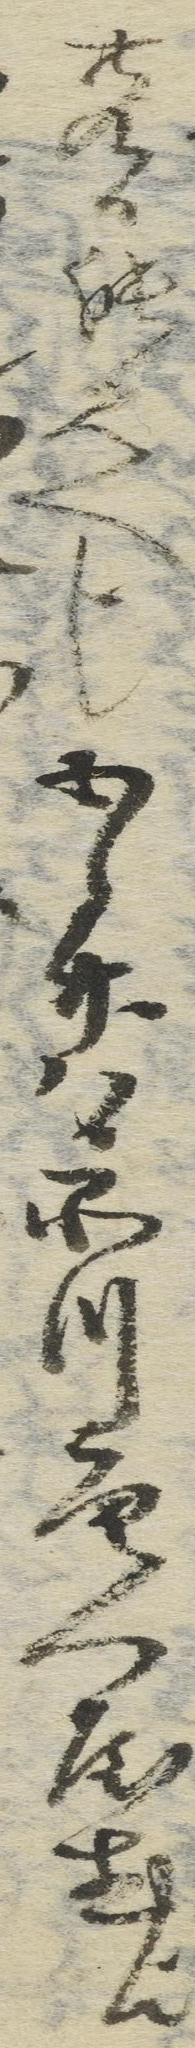廿九日能見へ申候五月廿八日品川唐人屋敷江
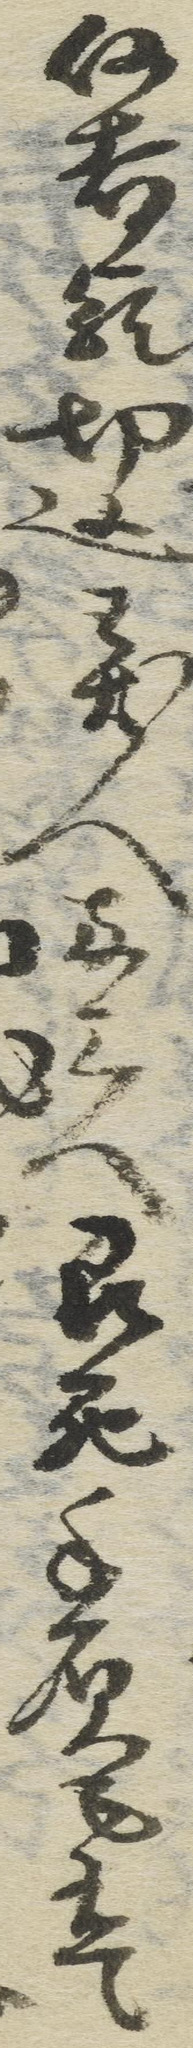何者か切込異人両三人即死手負も有之候
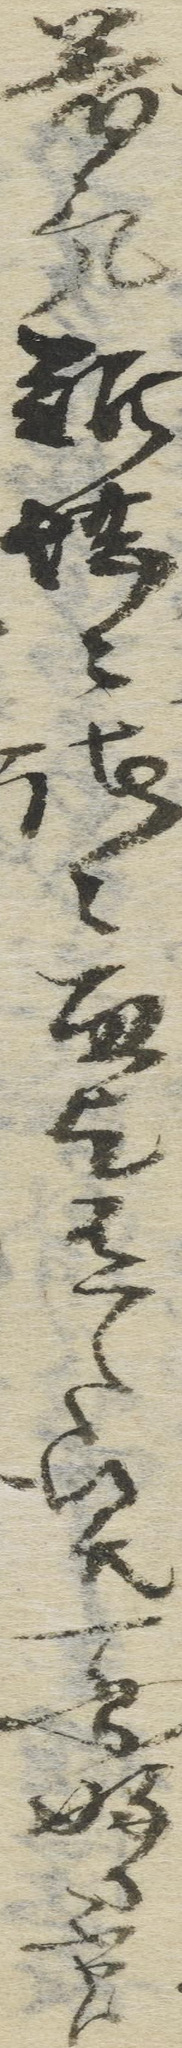暑気難堪二諸々雨乞有之候得共一圓呼不申候
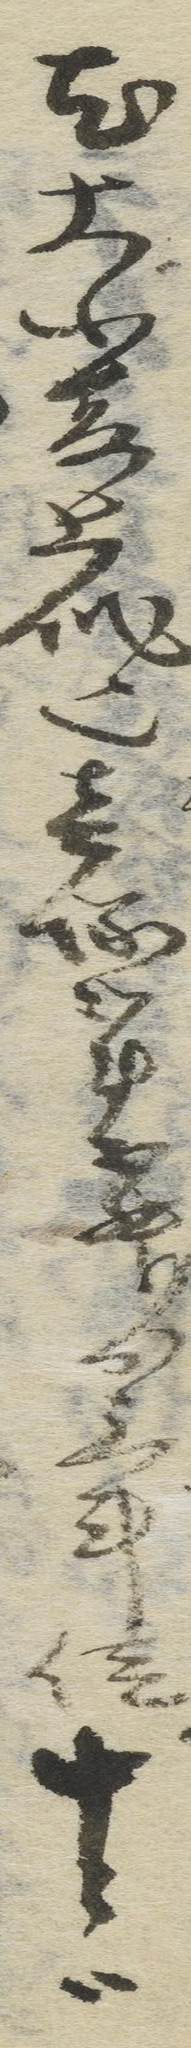尤大小麦上作也壱抔弐斗五升ゟ三斗位中二ハ
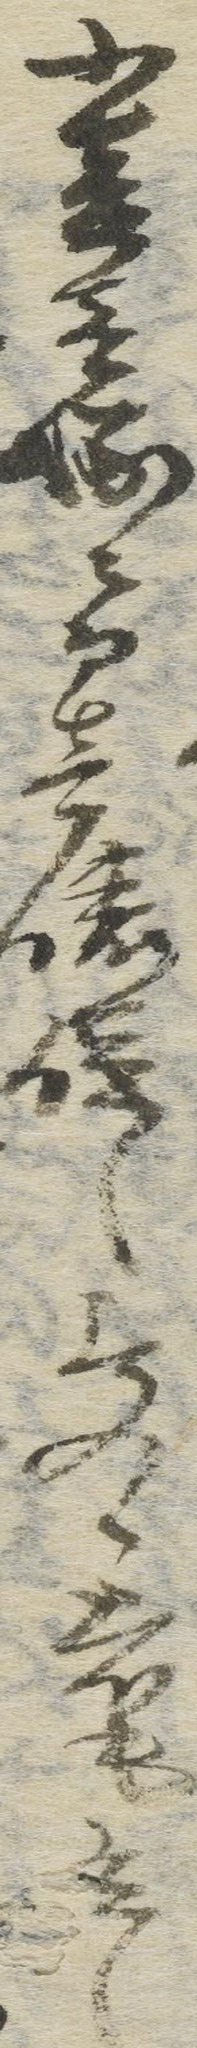小麦壱抔二而壱俵位之もの三筆有之
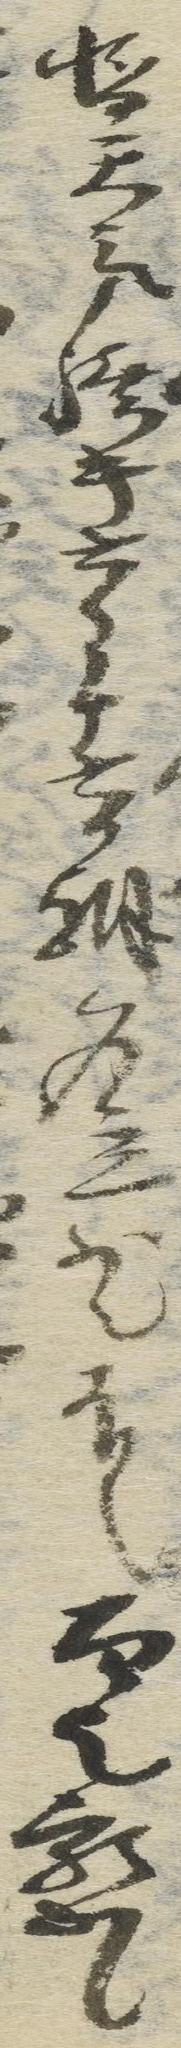暫天気続六月十六日朝夕立少し有之雨乞願出し
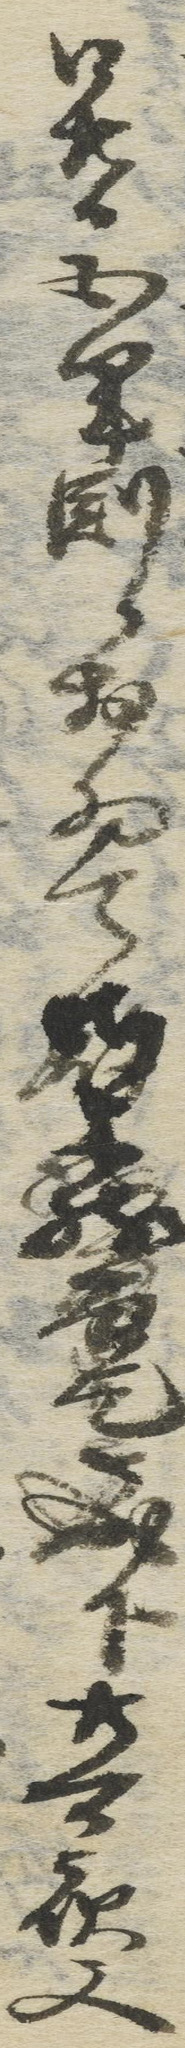同廿日五里剛二おゐて御上様雨乞被成下廿一日夜二入
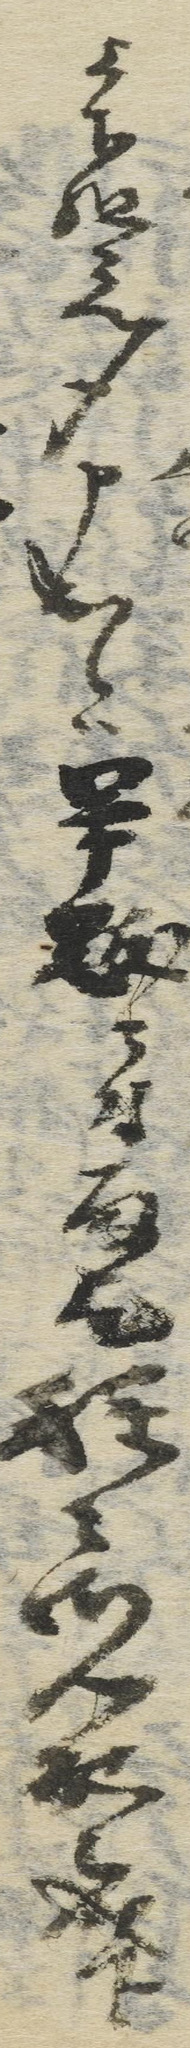上下組元〆申出候ハ旱魃二付雨乞種々御心配被成下
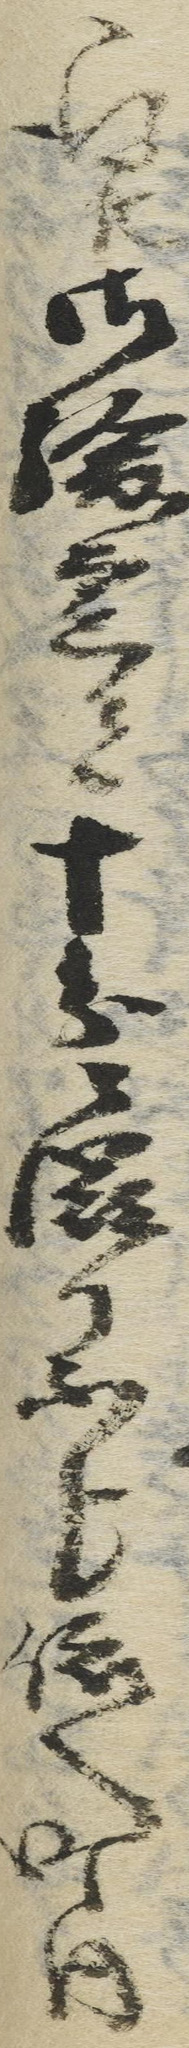候得共御蔭而巳二而十分御湿不申候依之町内
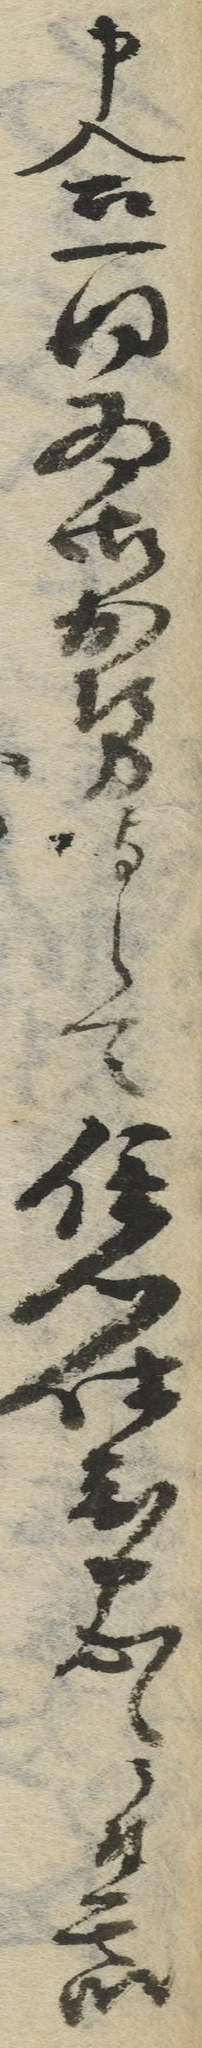申合一同為御かけり？として信心仕度申出候二付其段
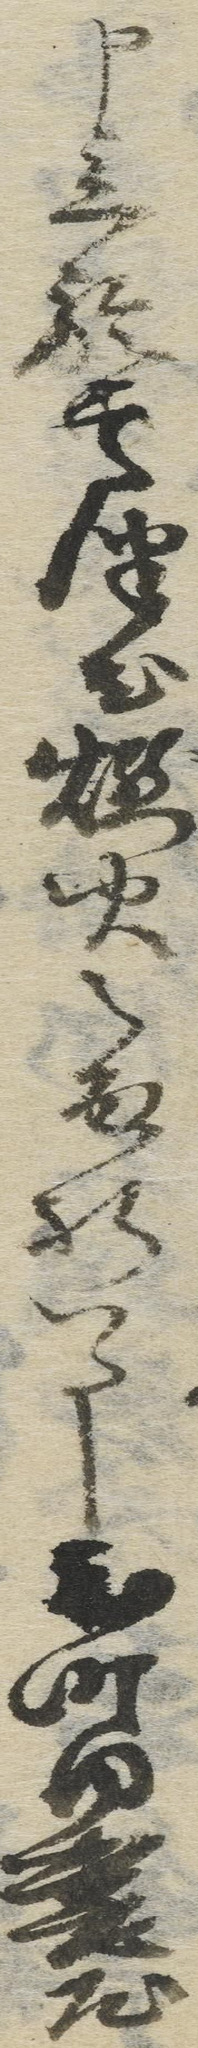申立於高沢屋燃火之雨祈いたし本町内裏屋
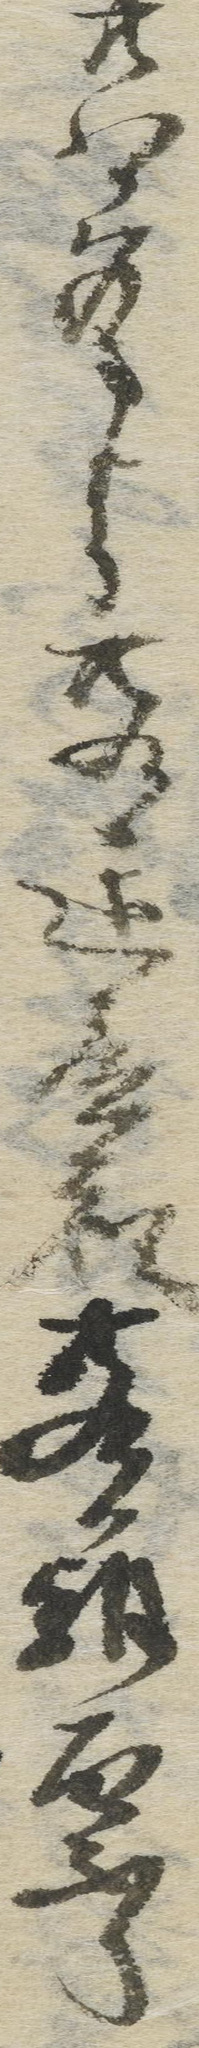廿八日夕方より廿九日迄雨祈廿九日朝雨ふり
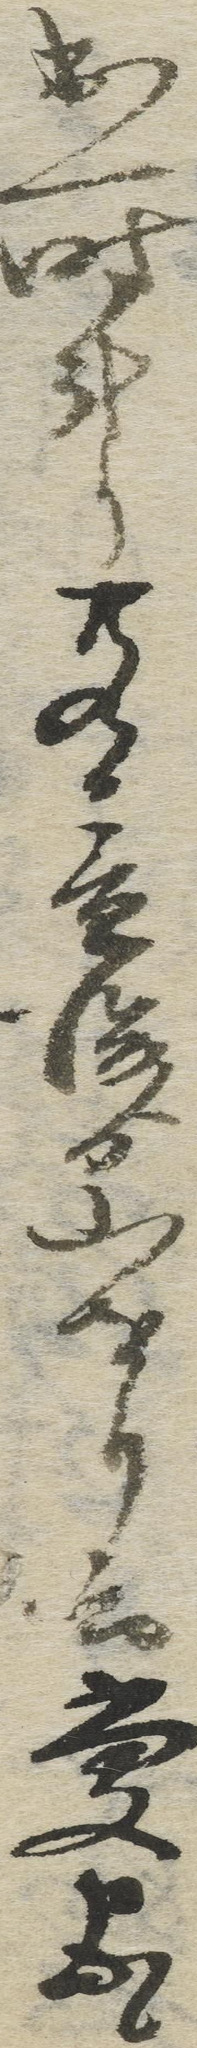出一時計り廿九日昼後ゟ山をり而尚又申出候
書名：信濃越後　地震書留
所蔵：東京大学地震研究所図書室 Earthquake Research Institute Library, The University of Tokyo, JAPAN
